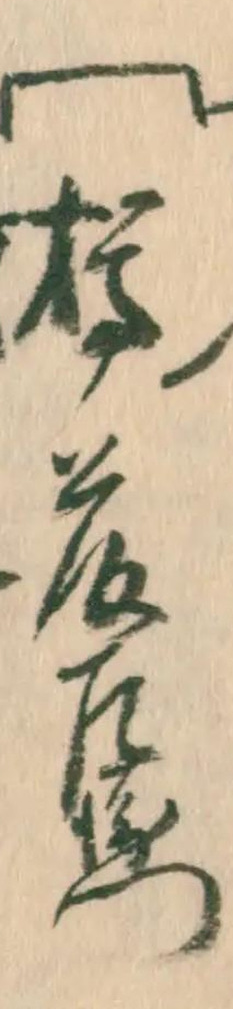樽藤左衛門
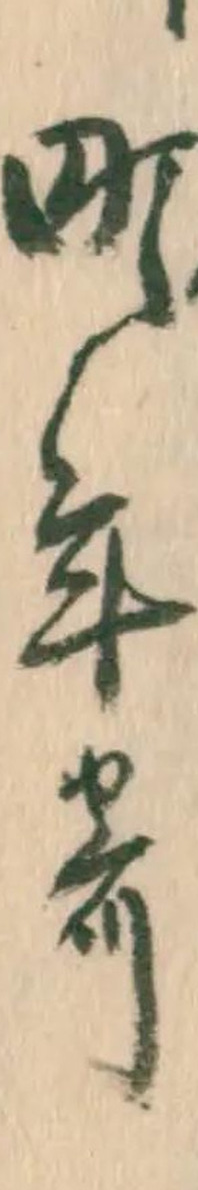町年寄
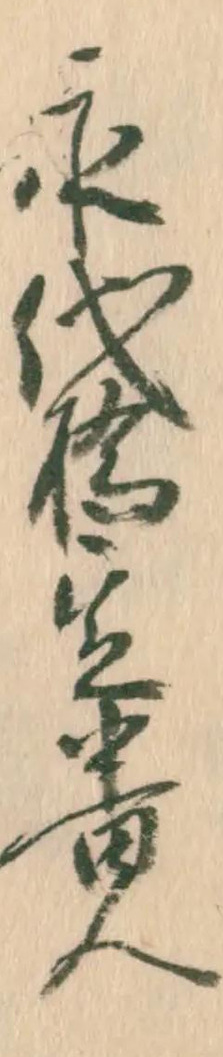永代橋定番人

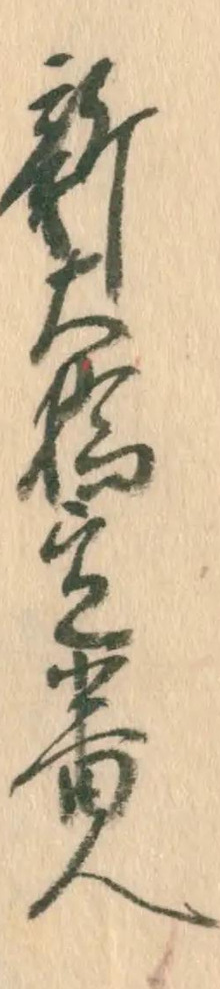新大橋定番人
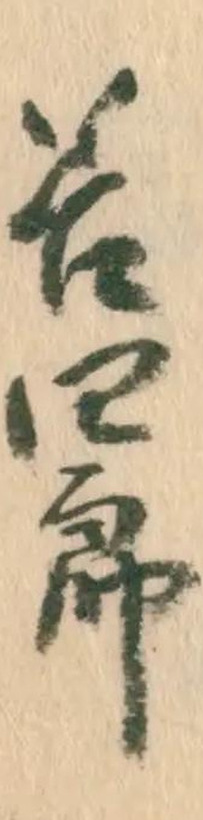善四郎
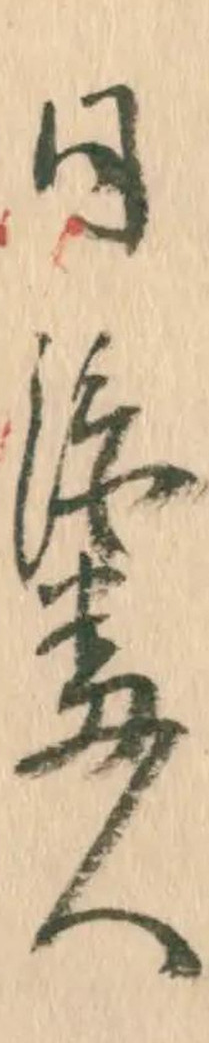同添番人
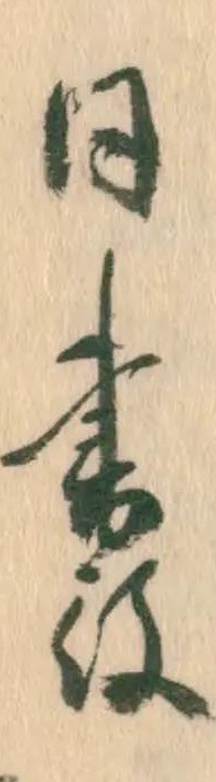同書役
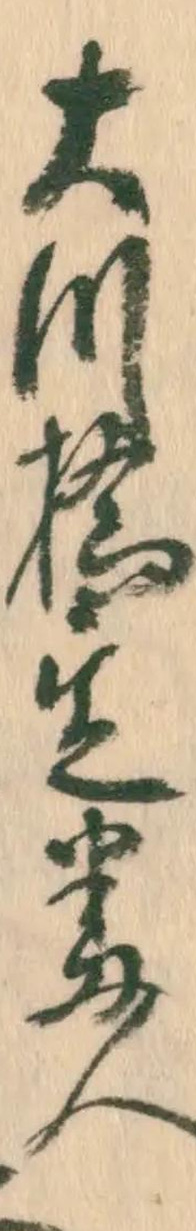大川橋定番人
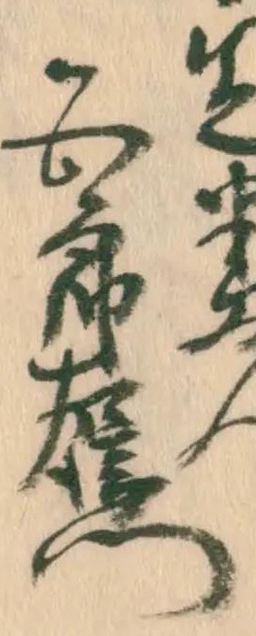五郎右衛門
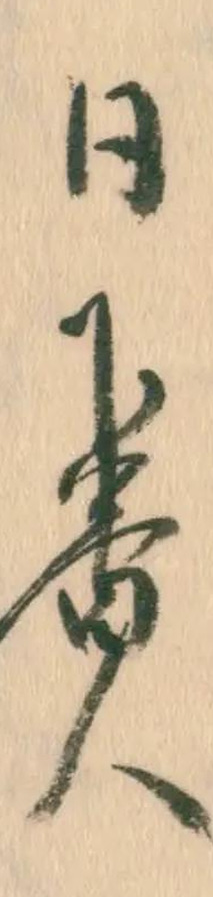同下番人
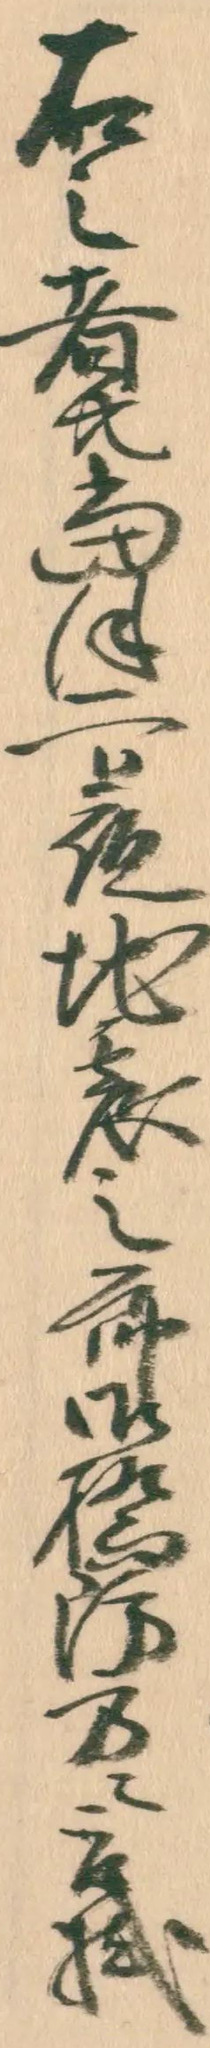右之者共当月二日夜地震之節御橋防方ニ取掛
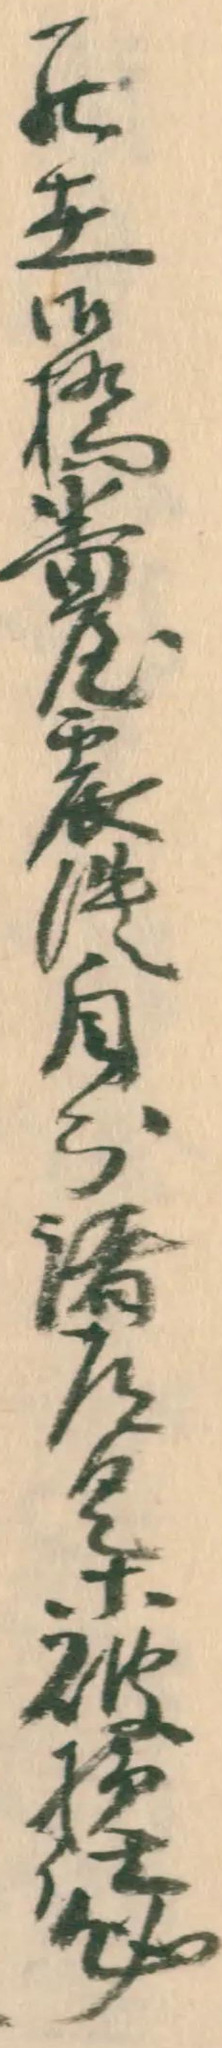罷在御橋番屋震潰自分諸道具等破損仕必
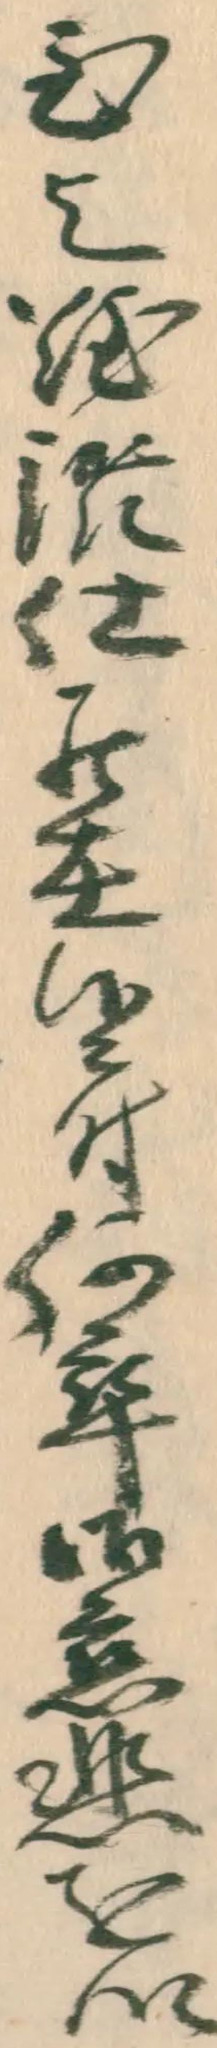至と難渋仕罷在候ニ付何卒御慈悲を以
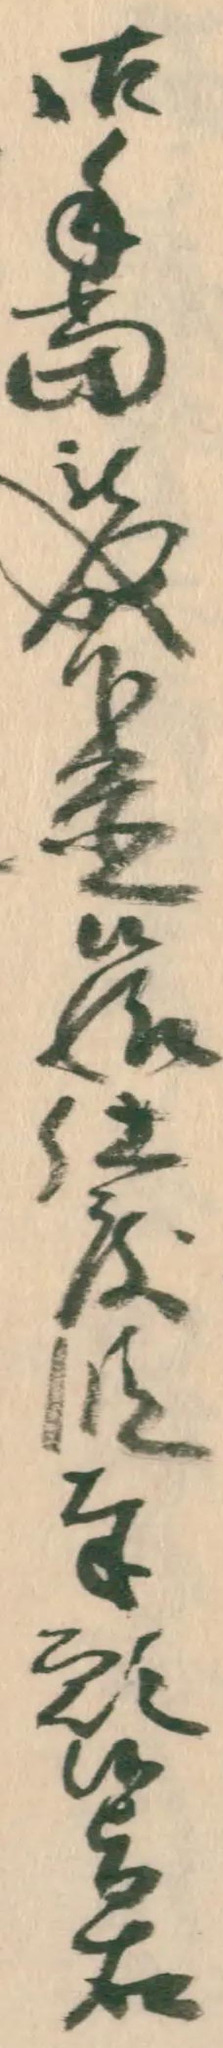御手当被成下置候様仕度段奉願候旨右
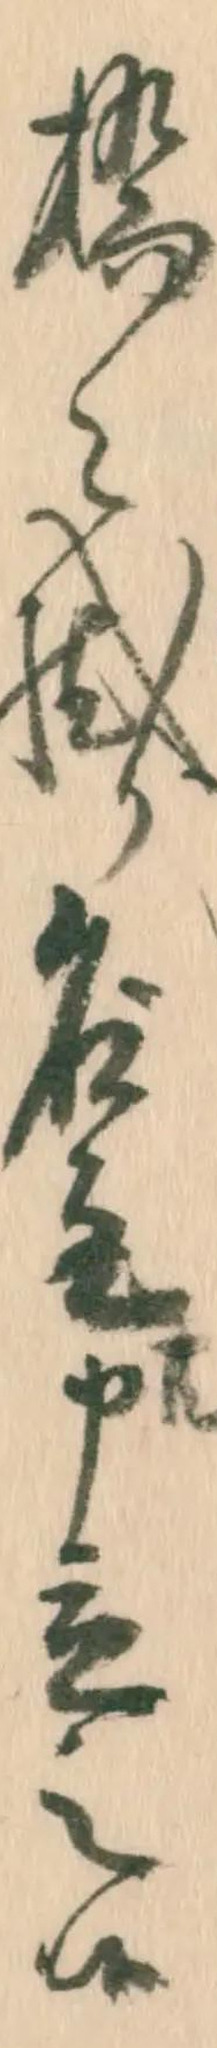橋々掛り名主共申立之候

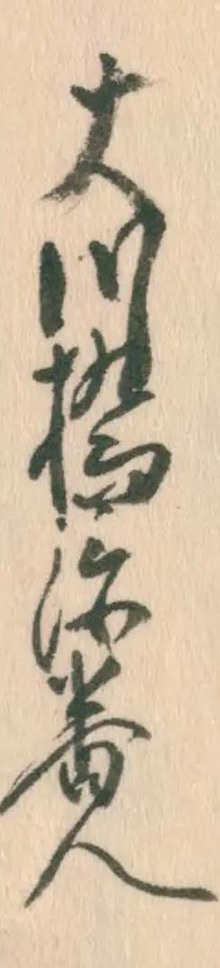大川橋添番人
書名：三橋 17巻. [8] 三橋小破御修復書留　但御奉行御掛リ替地震潰橋番屋　嘉永四亥年より安政二卯年迄　下
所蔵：国立国会図書館 National Diet Library, JAPAN
